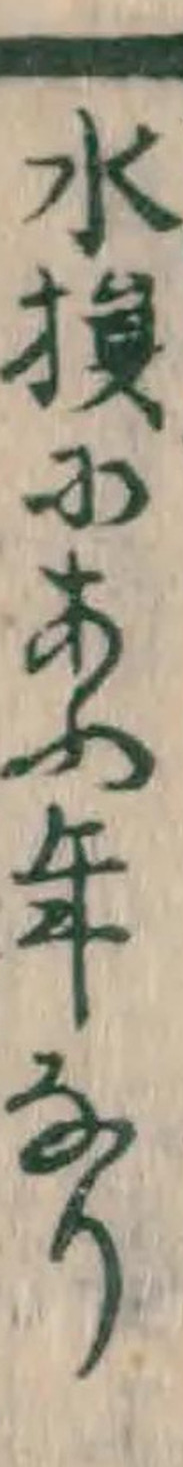水損にあふ年なり
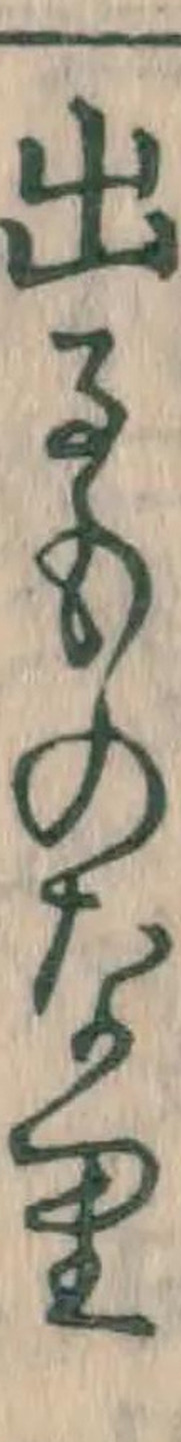出るものなり
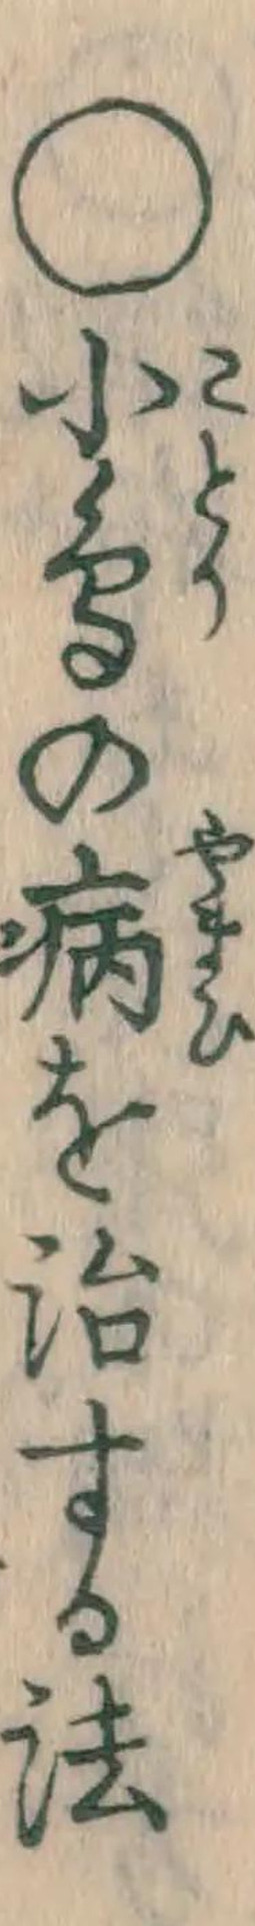○小鳥の病を治する法
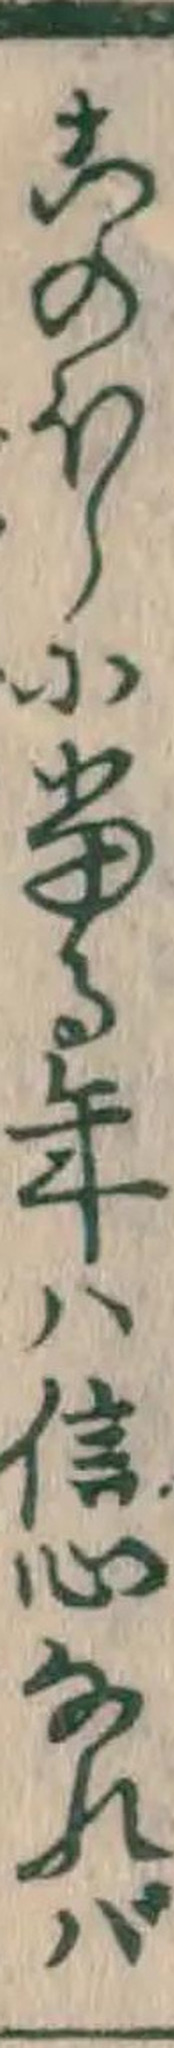このほしに当る年は信心なれば
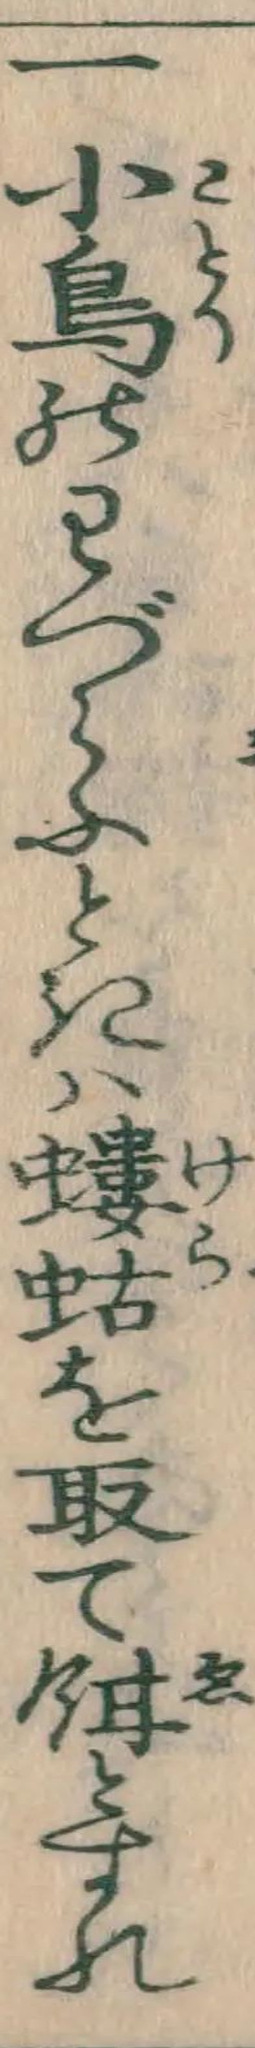一小鳥のわづらふときは螻蛄を取て餌とすれ
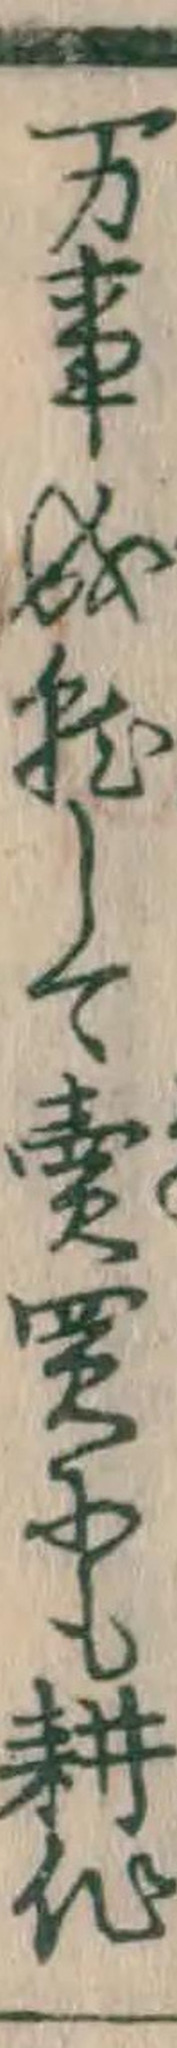万事成就して売買にも耕作
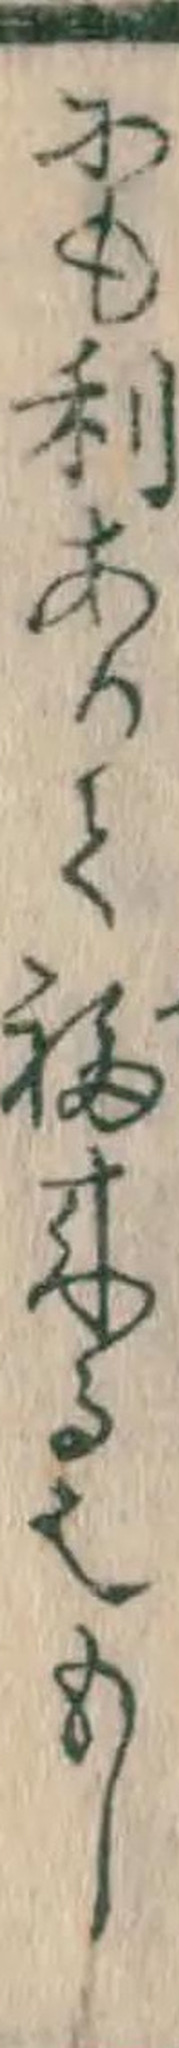にも利ありて福来る也もし
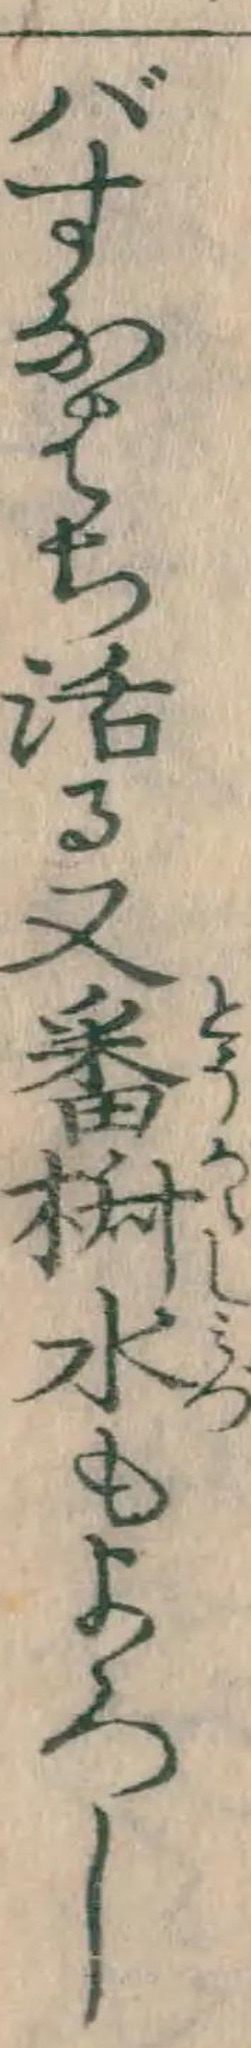ばすなはち活る又番椒水もよろし
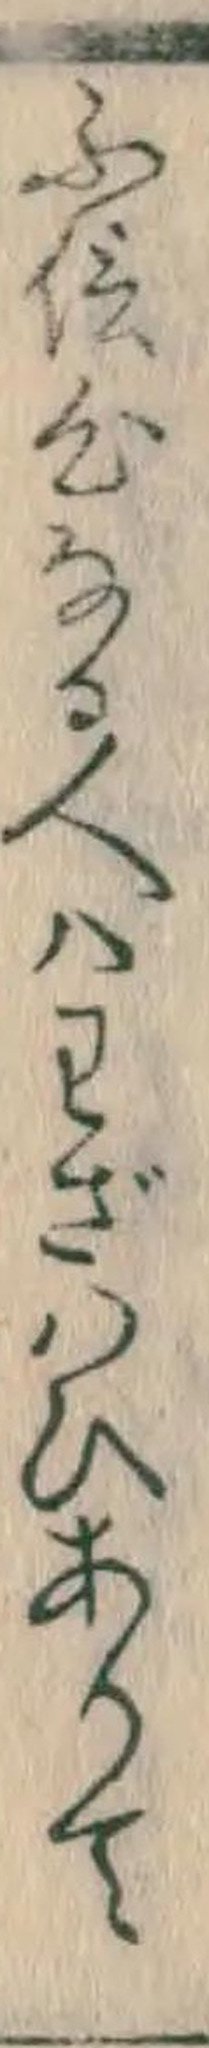不信心なる人はわざはひありて
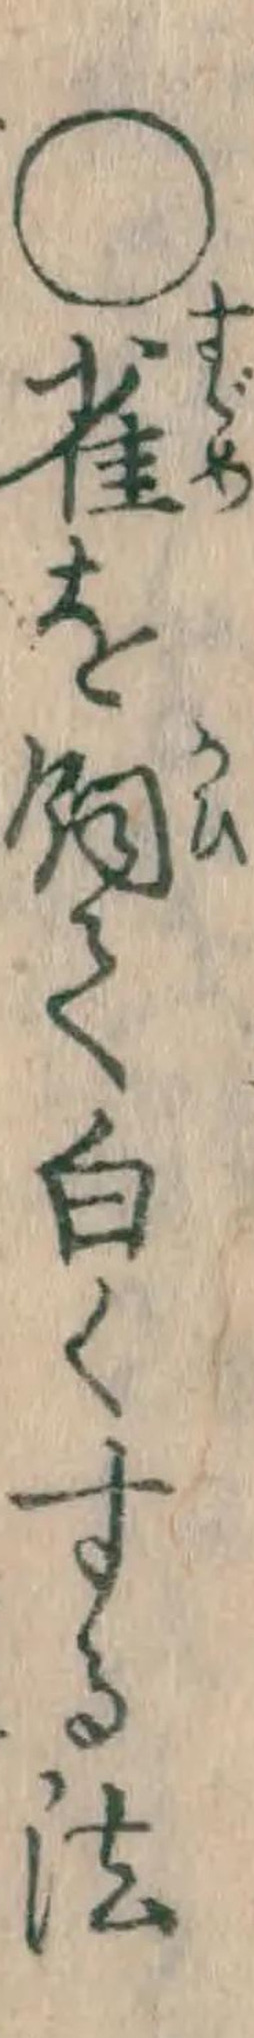○雀を飼て白くする法
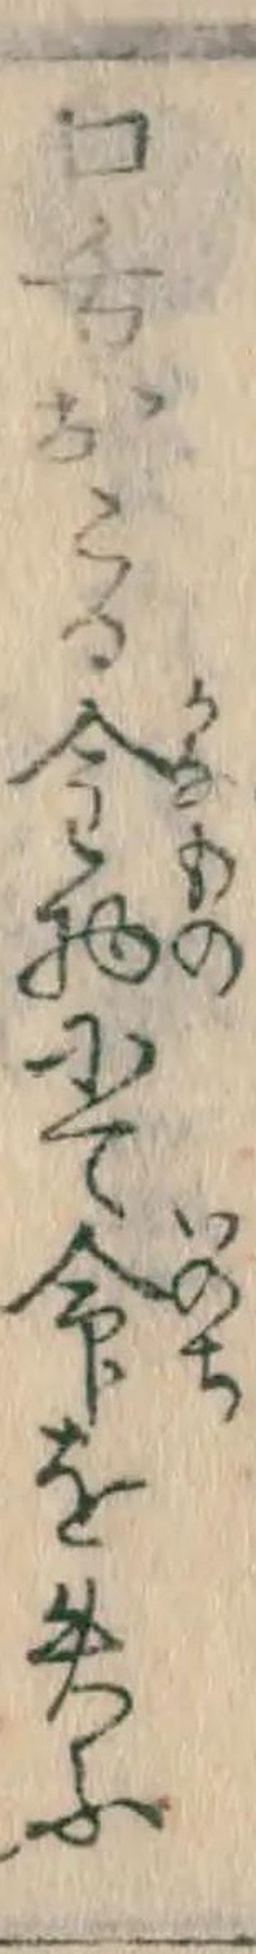口舌おこる金物にて命を失ふ
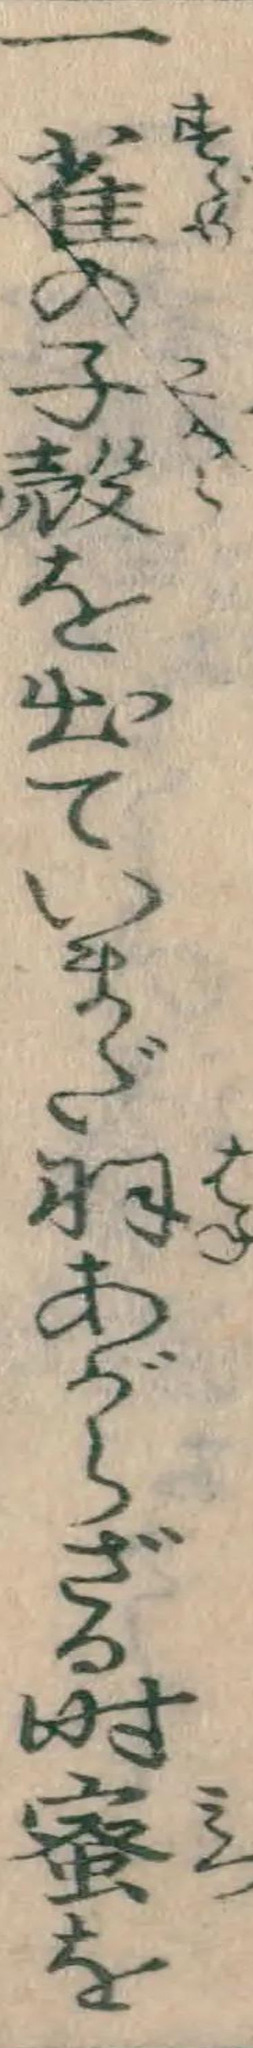一雀の子殻を出ていまだ羽あがらざる時蜜を
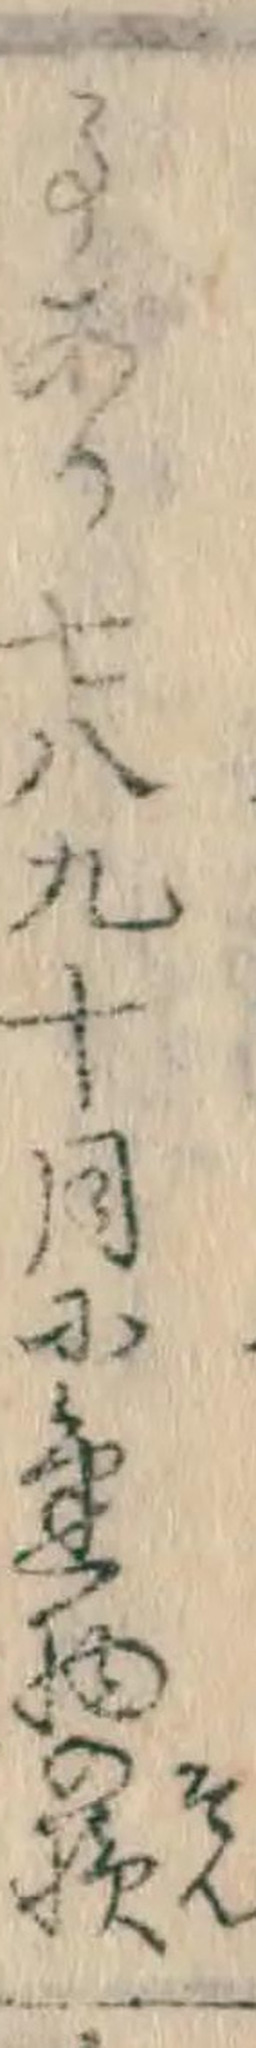事あり七八九十月に金物の損
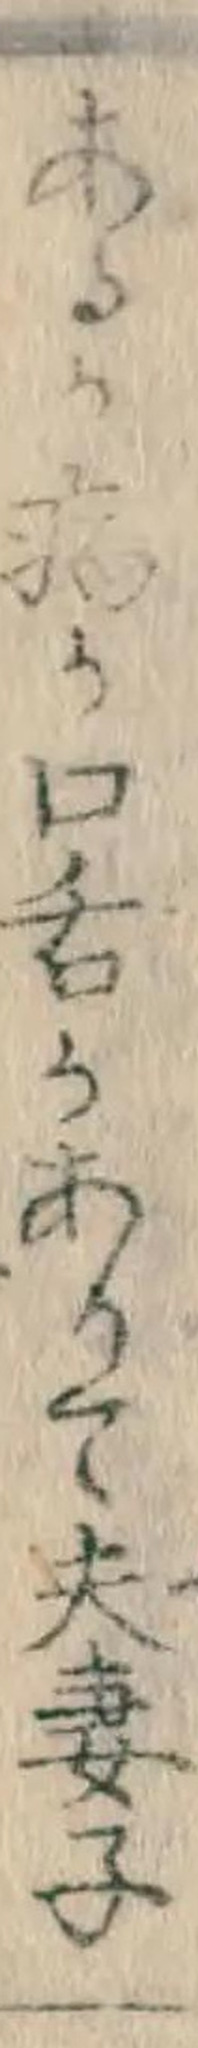あるか病か口舌かありて夫妻子
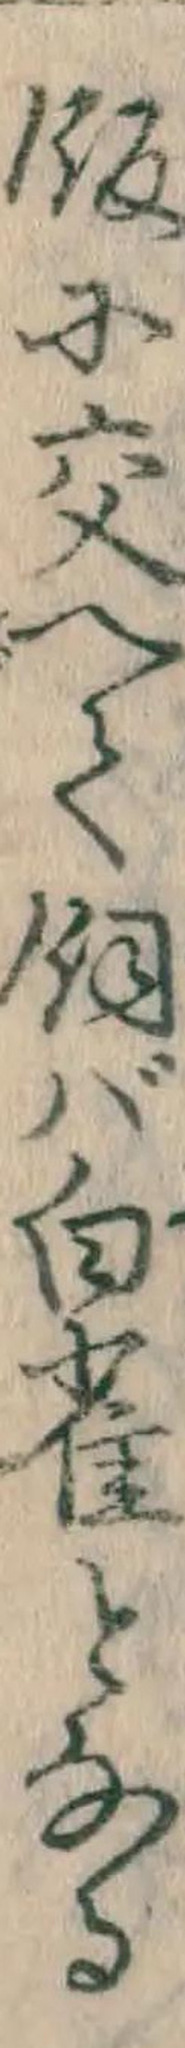飯に交へて飼ば白雀となる
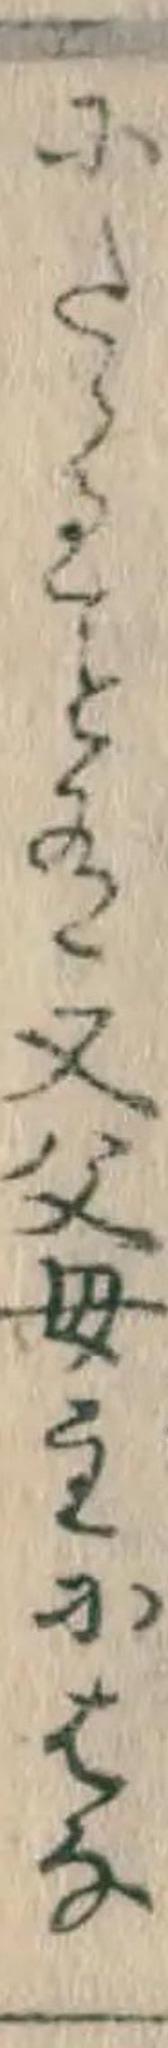にたゝること有又父母主にはな
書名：広益秘事大全 3巻. [1]
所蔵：国立国会図書館 National Diet Library, JAPAN
